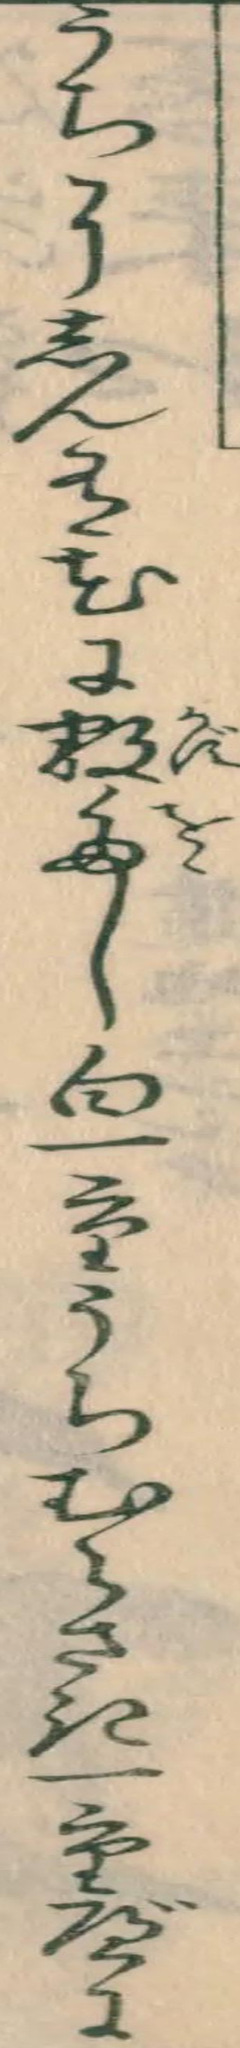うちにしん有花に数多し白一重うちむらさき一重べに
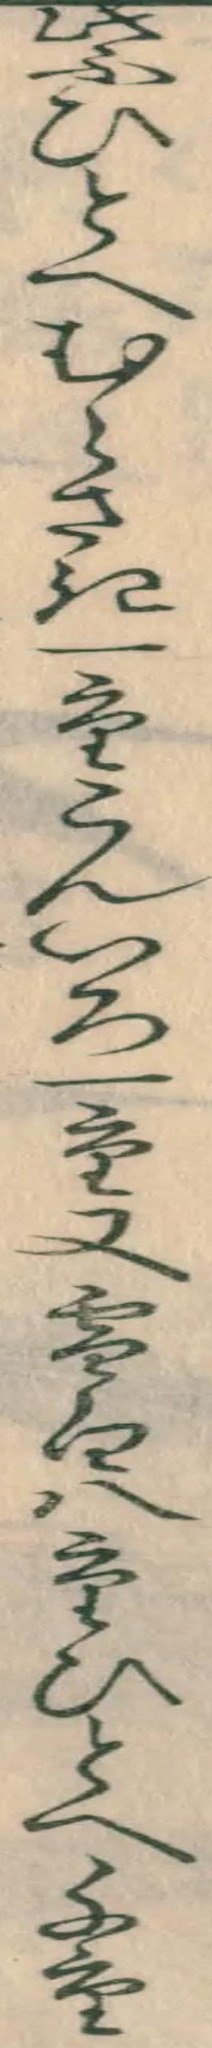紫ひとへむらさき一重こんいろ一重又雪白八重ひとへ千重
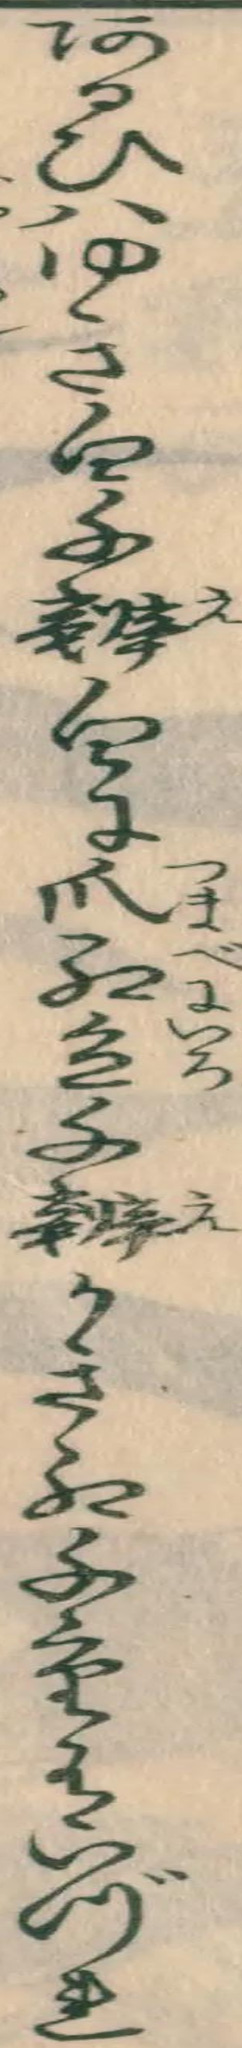あるひはゆき白千弁白に爪紅色千弁かき紅千重有いづれ
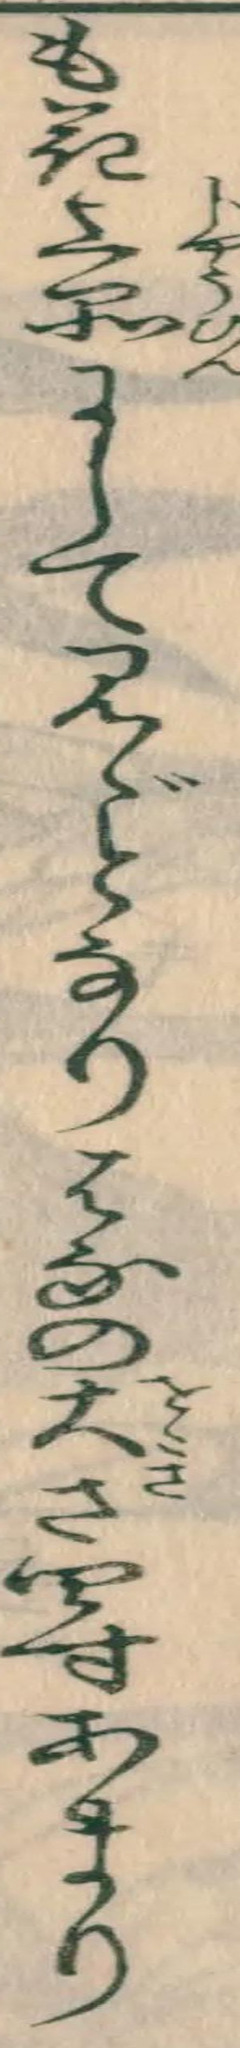も花上品にして見ごとなりはなの大さ四寸あまり
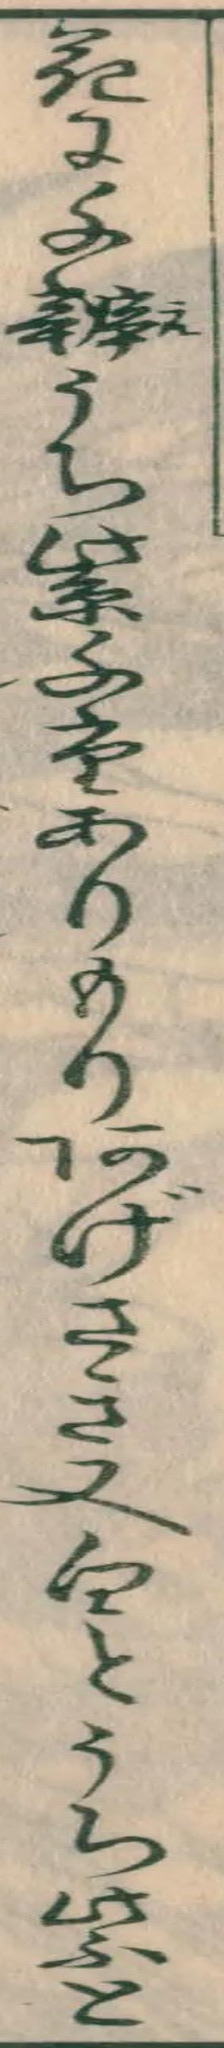花に千弁うち紫千重ありもりあげさき又白とうち紫と
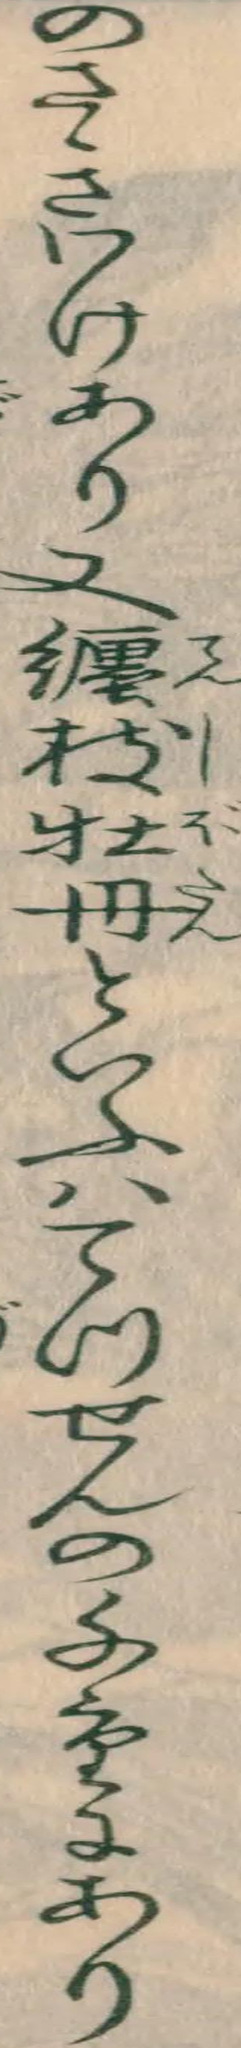のさきわけあり又纏枝牡丹といふはてつせんの千重にあり
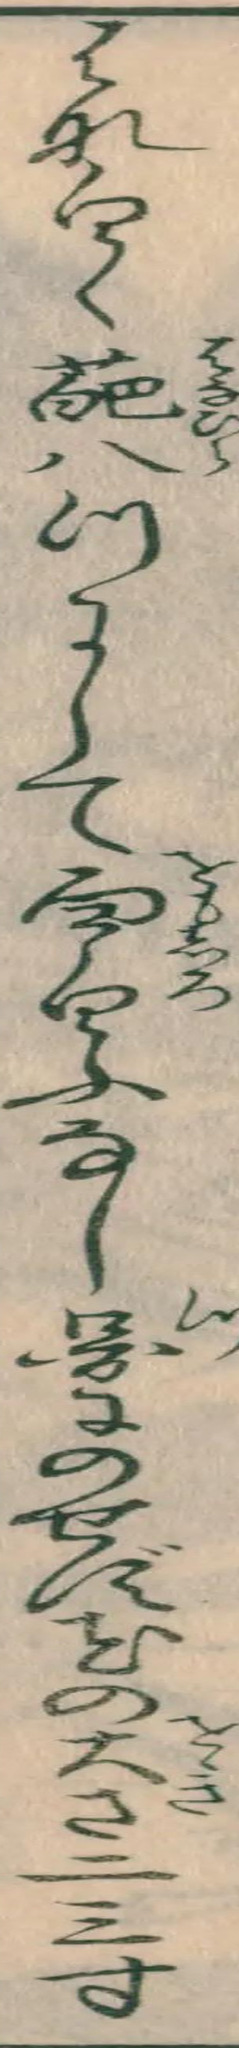はな白く葩八つにして面白ふなし図にのせず花の大さ二三寸
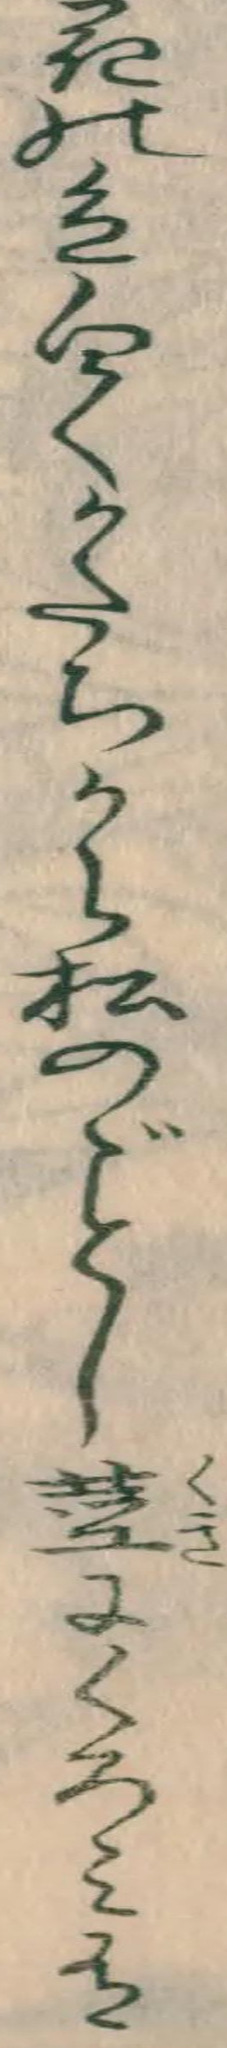花の色白くかたちから松のごとし茎にくろみ有
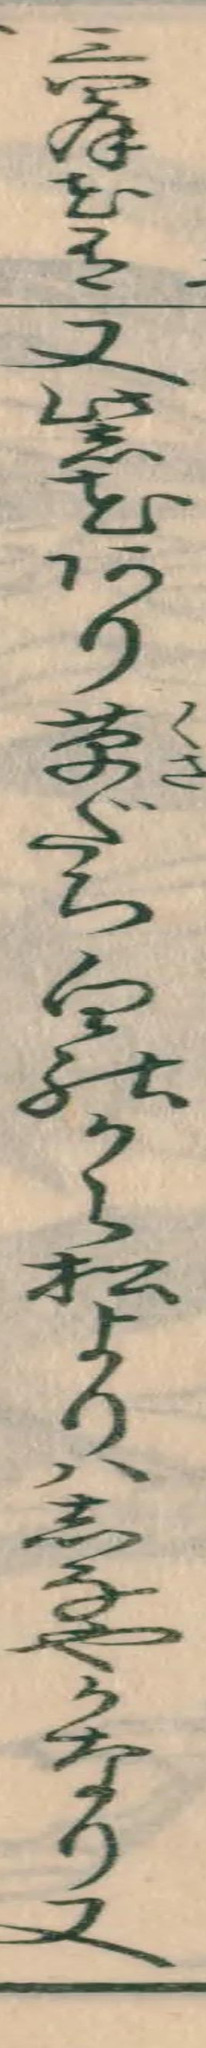又紫花あり草だち白のから松よりはしなやかなり又
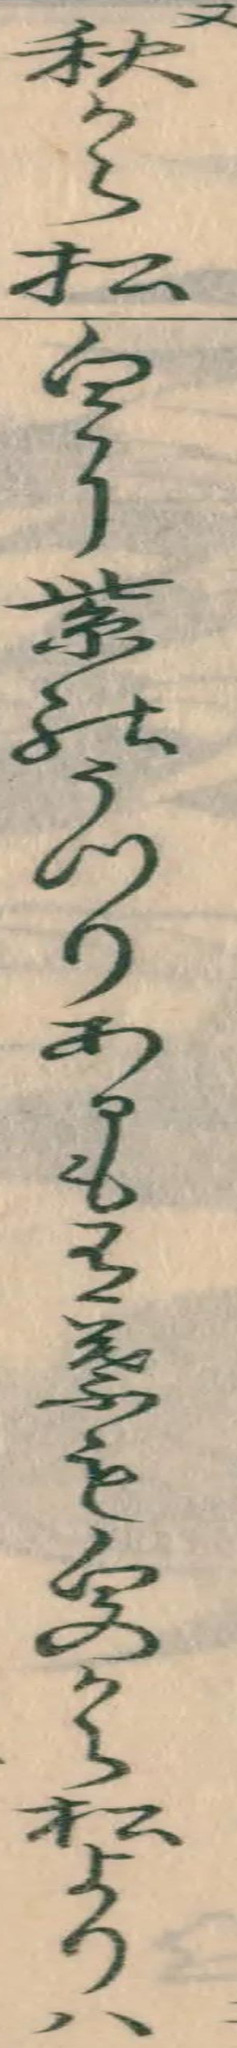白に紫のうつりあるも有葉も白のから松よりは
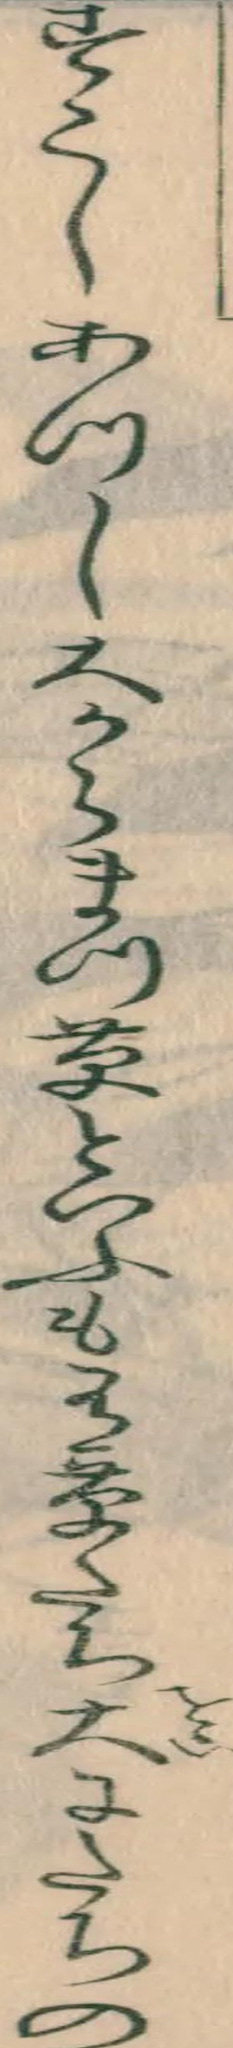すこしあつし大からまつ草といふも有草たち大にたちの
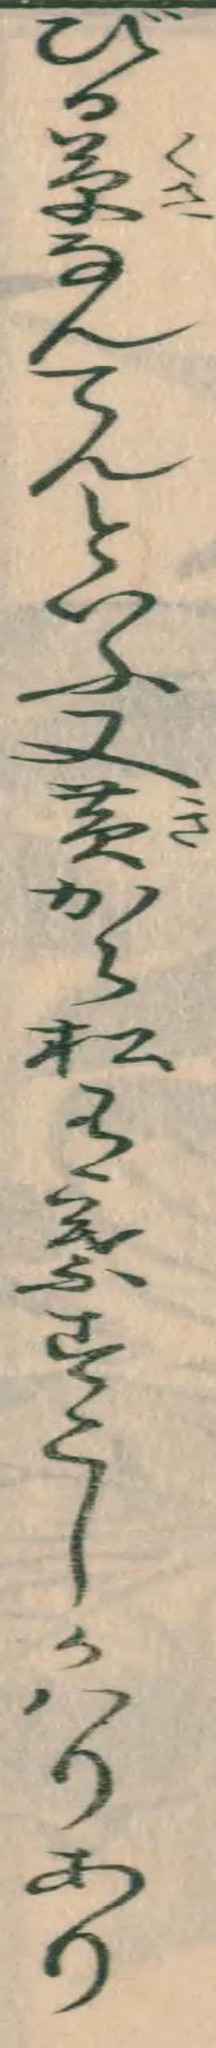びる草なんてんといふ又黄から松有葉すこしかはりあり
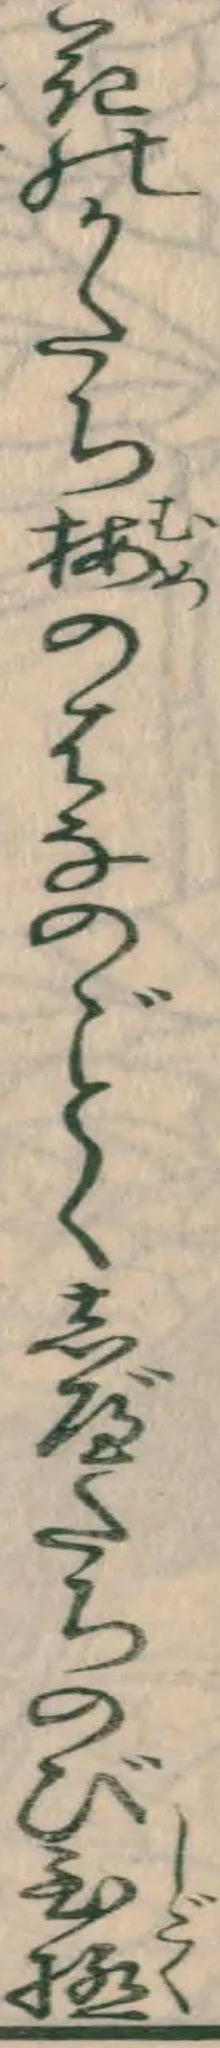花のかたち梅のはなのごとくしべたちのび至極
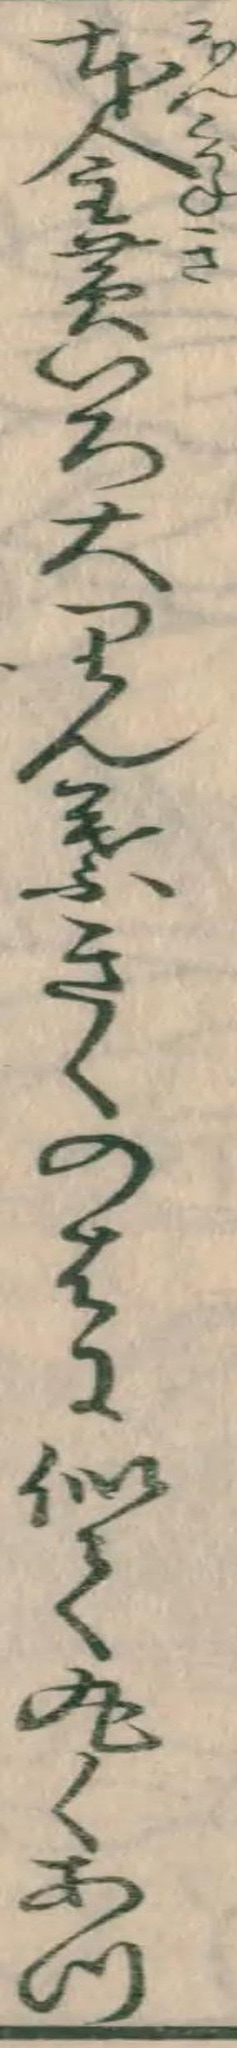本金黄いろ大りん葉きくのはに似て丸くあつ
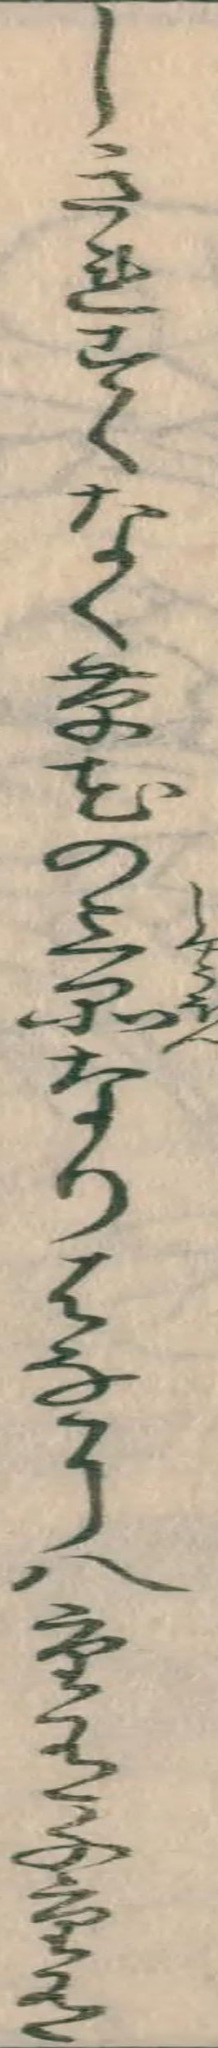しきれすくなく草花の上品なりはなに八重有千重有
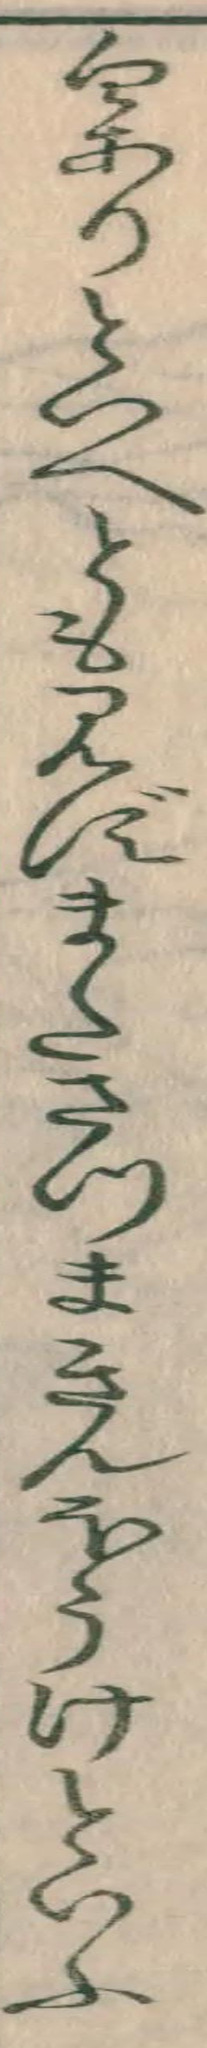白ありといへとも見ずまたさつまきんほうけといふ
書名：畫本野山草. [5]
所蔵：国立国会図書館 National Diet Library, JAPAN
